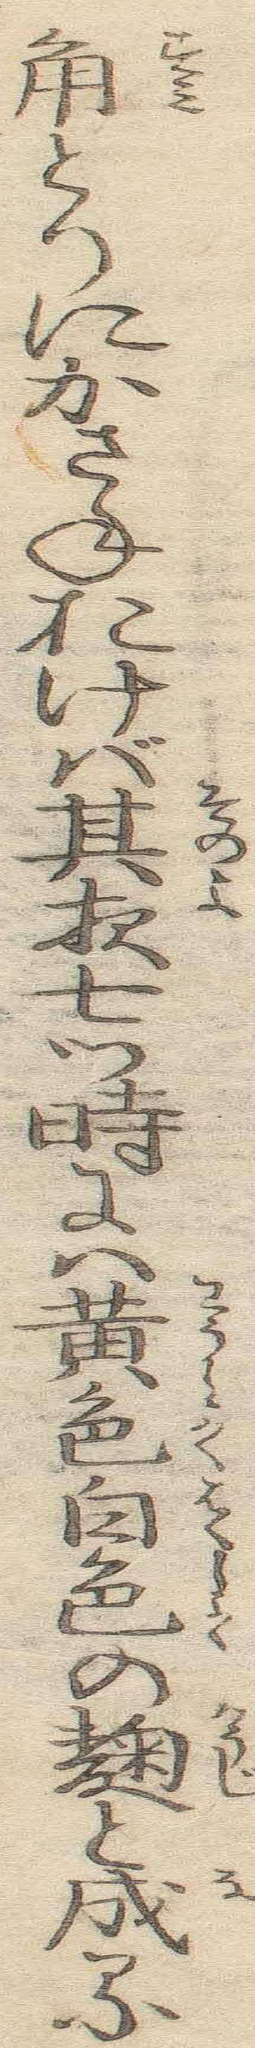角とりにかさねおけば其夜七ツ時には黄色白色の麹と成る
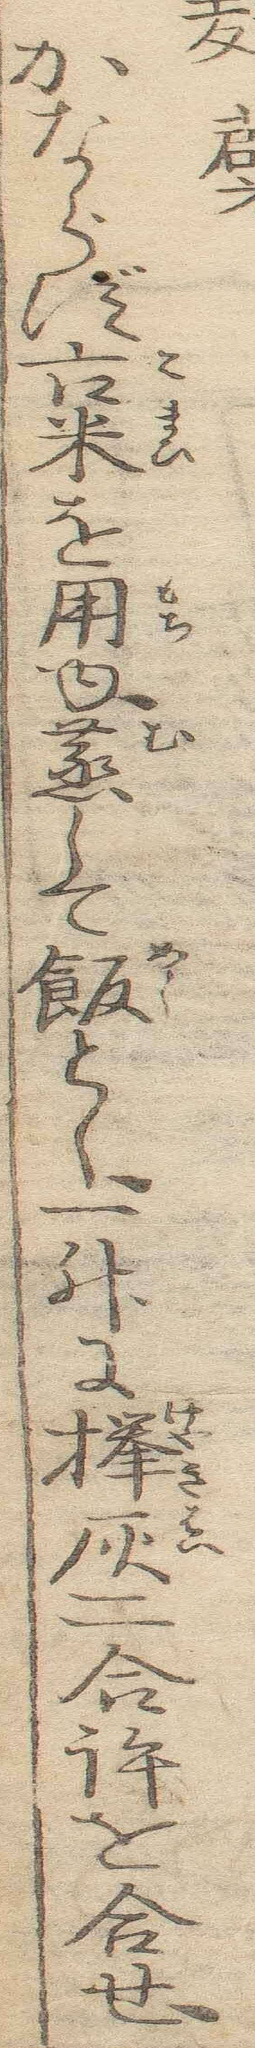かならず古米を用ゆ。蒸して飯とし。一升に欅灰二合許を合せ。

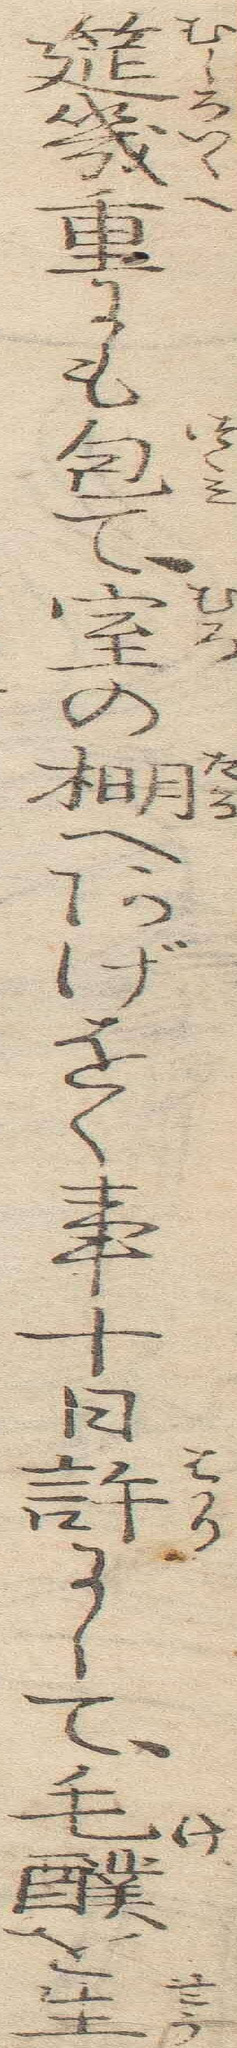筵幾重にも包て。室の棚へあげをく事十日許にして。毛醭を生
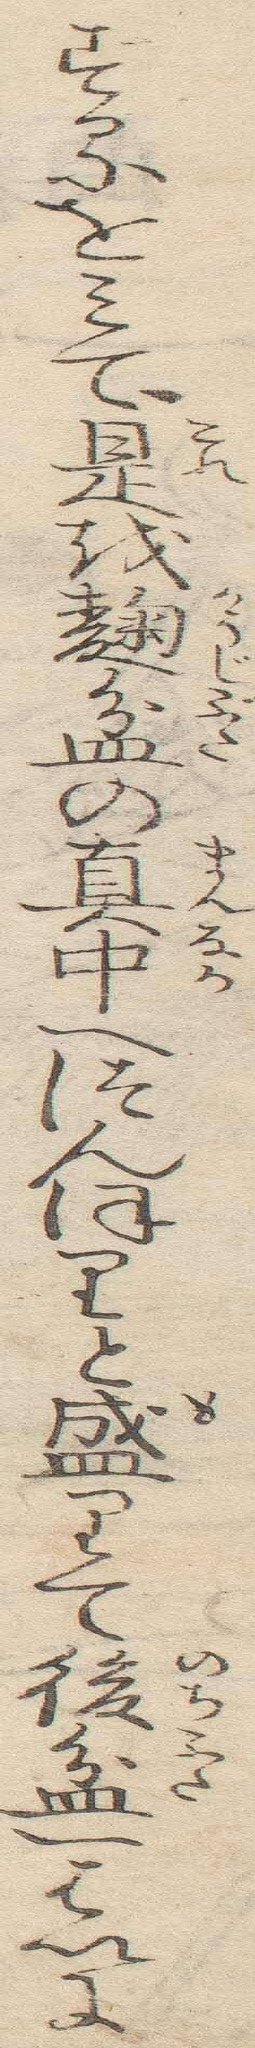ずるをみて。是を麹盆の真中へつんほりと盛りて後盆一はいに
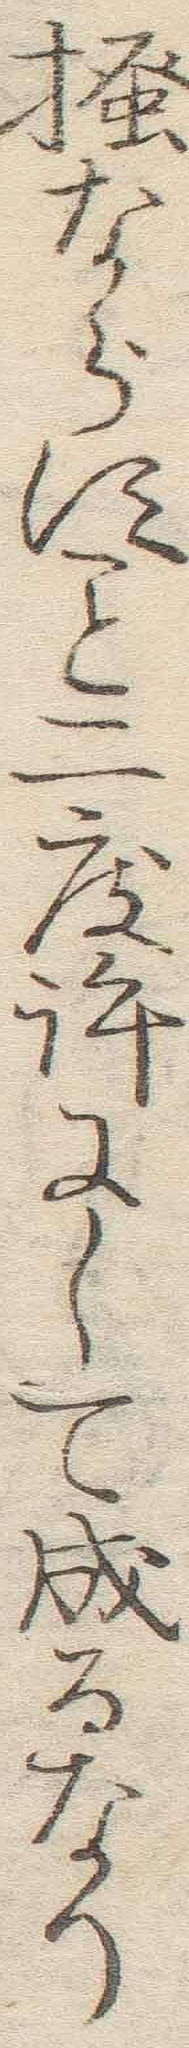掻ならすこと二度許にして成るなり
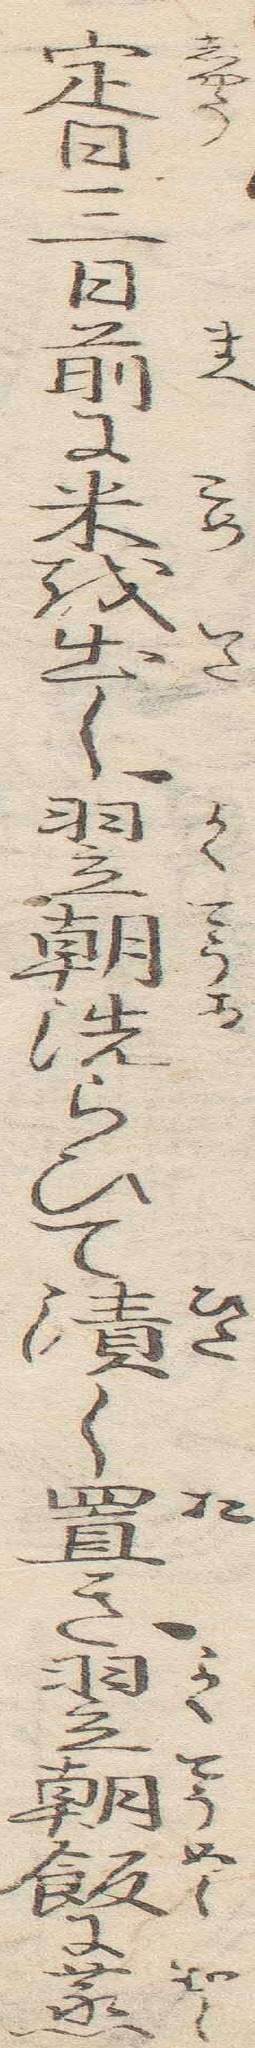定日三日前に米を出し。翌朝洗らひて漬し置き。翌朝飯に蒸
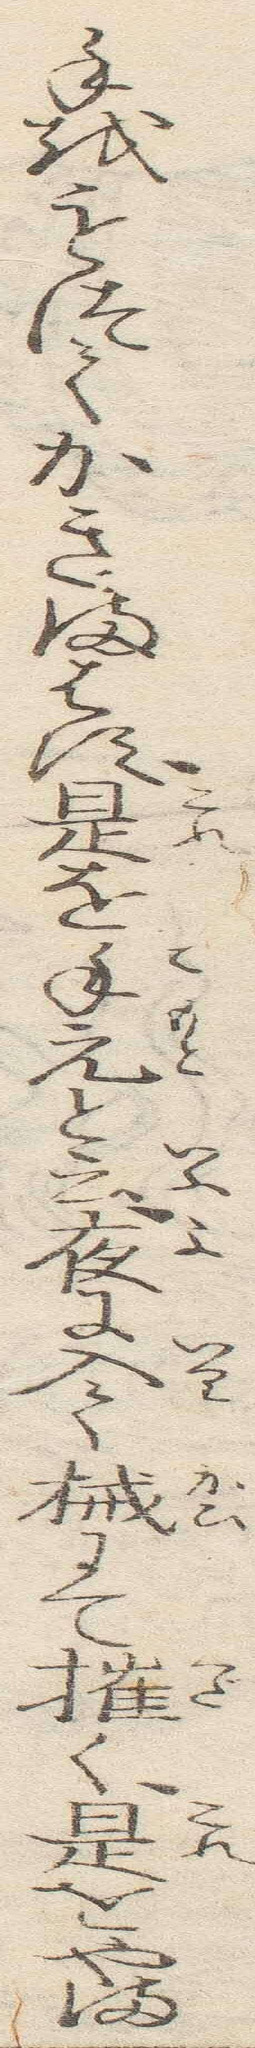手をもつてかきまはす。是を手元と云。夜に入て械にて摧く。是をやま
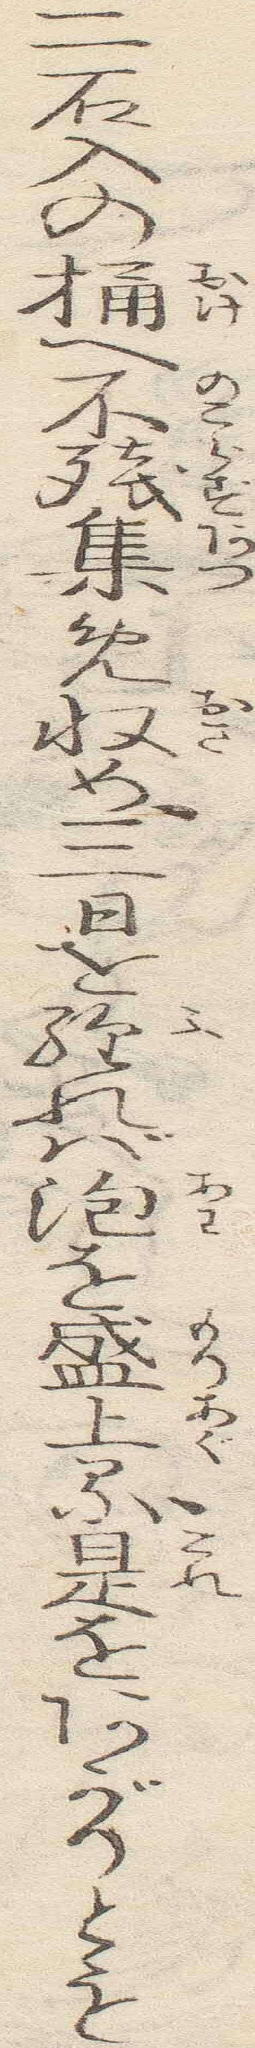二石入の桶へ不残集め収め。三日を経れば泡を盛上る。是をあがりとも
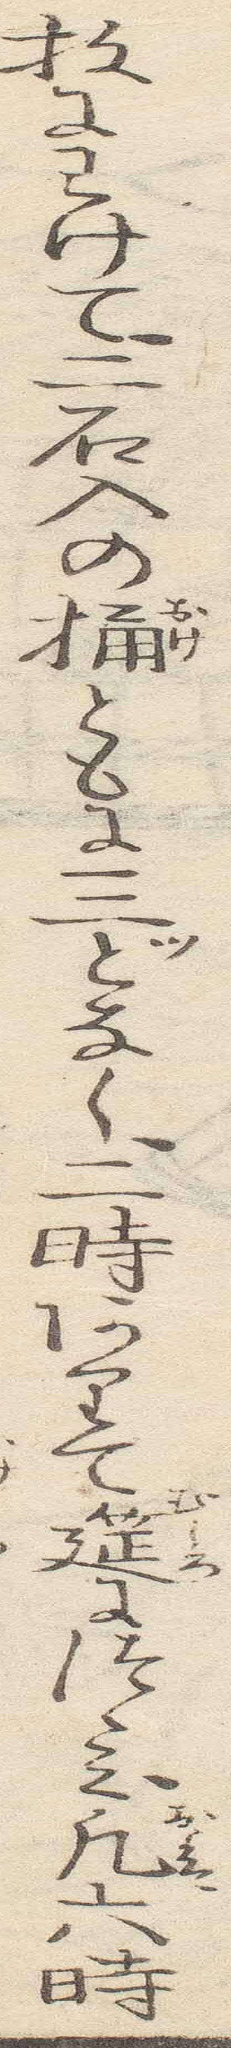枚にわけて。二石入の桶ともに三ツとなし。二時ありて筵につゝみ。凡六時
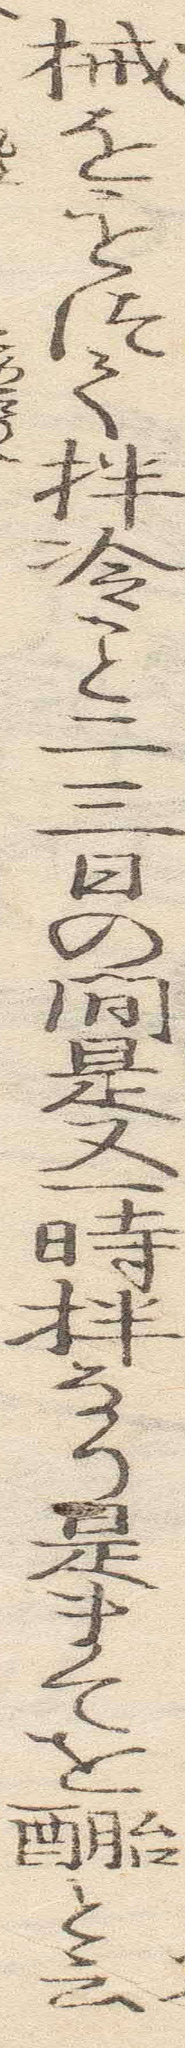械をもつて拌冷こと二三日の間。是又一時拌なり是まてをと云
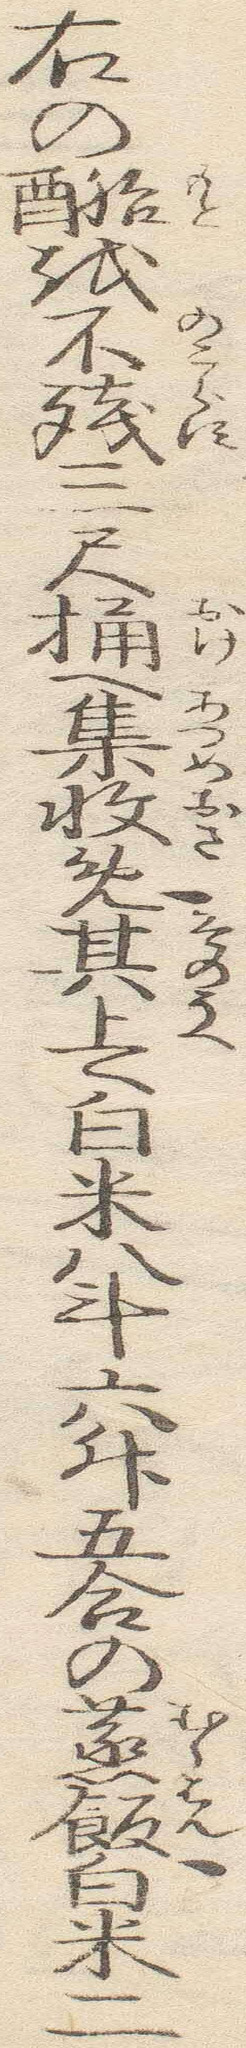右のを不残三尺桶へ集収め。其上へ白米八斗六升五合の蒸飯。白米二
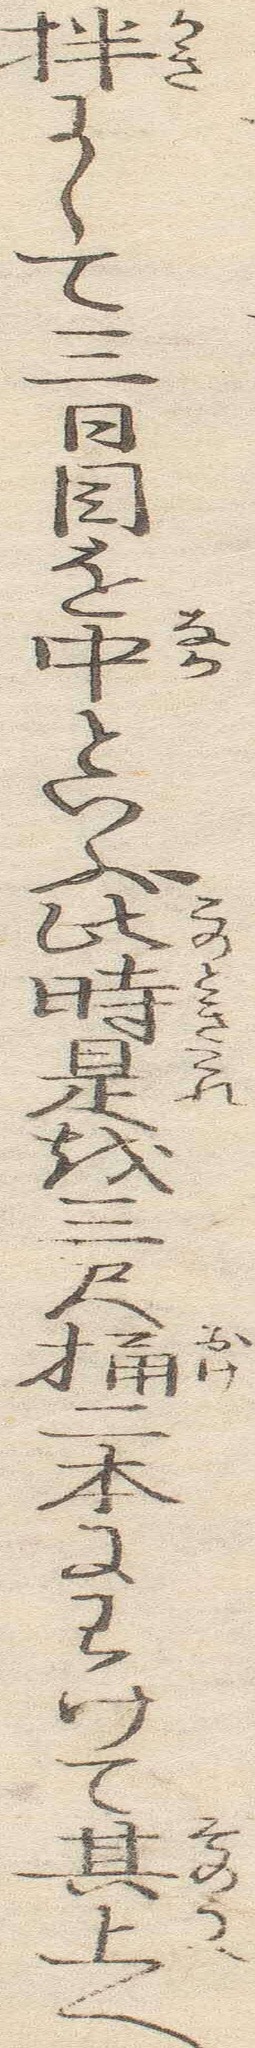拌にして三日目を中といふ。此時是を三尺桶二本にわけて其上へ
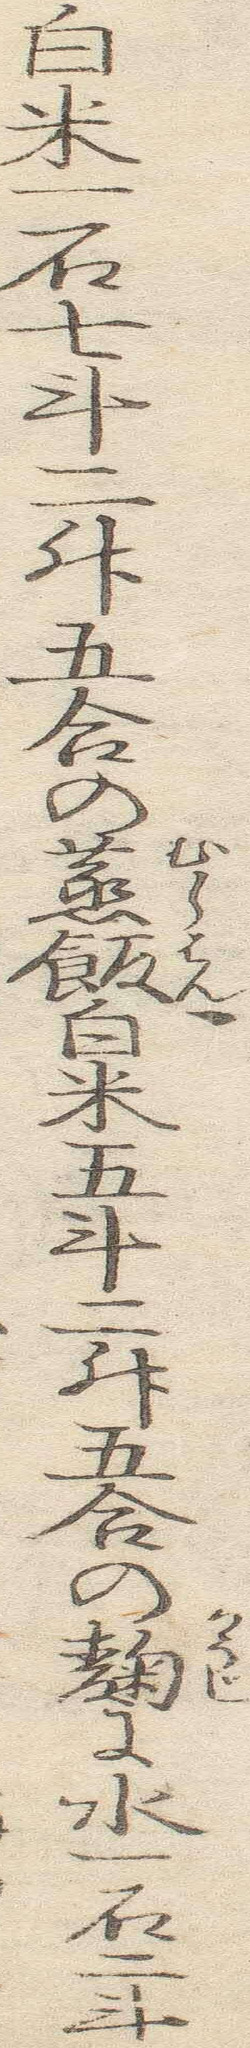白米一石七斗二升五合の蒸飯。白米五斗二升五合の麹に水一石二斗
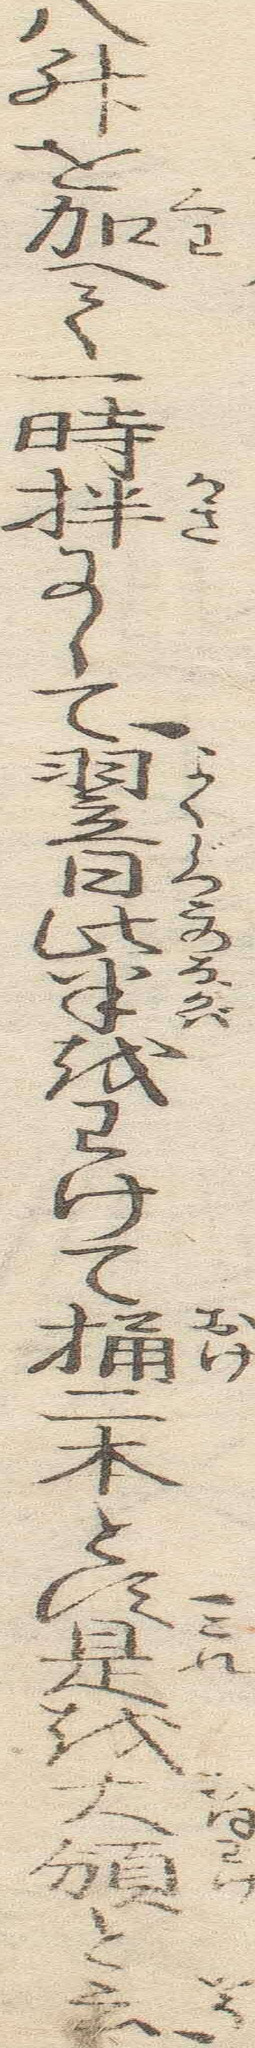八升を加へて一時拌にして。翌日此半をわけて桶二本とす。是を大頒と云。
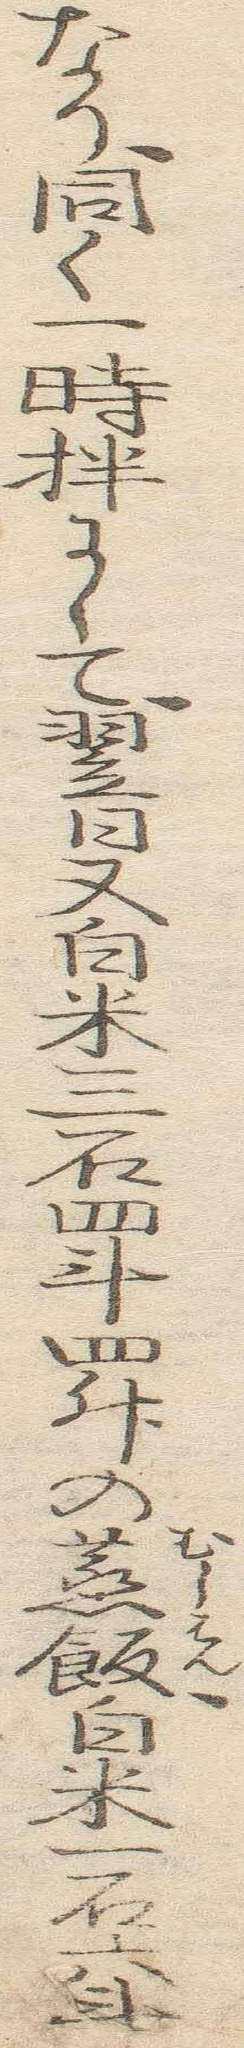なり。同く一時拌にして。翌日又白米三石四斗四升の蒸飯。白米一石六斗
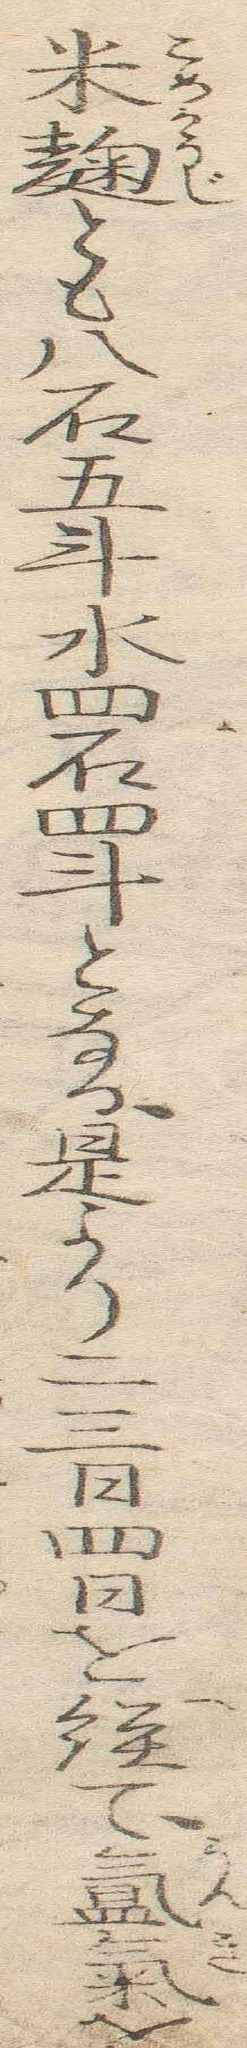米麹とも八石五斗水四石四斗となる。是より二三日四日を経て。氲気を
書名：日本山海名産図会
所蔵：東京学芸大学附属図書館 国文学研究資料館
